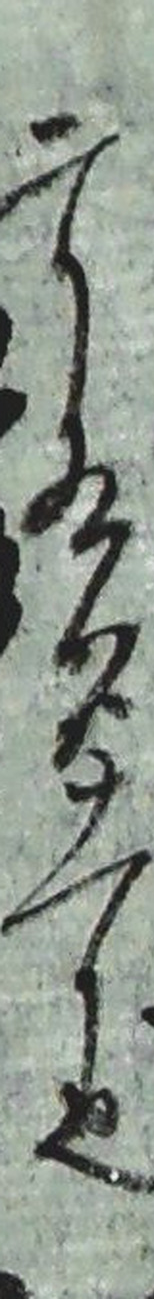二月九日ゟ十一日迄
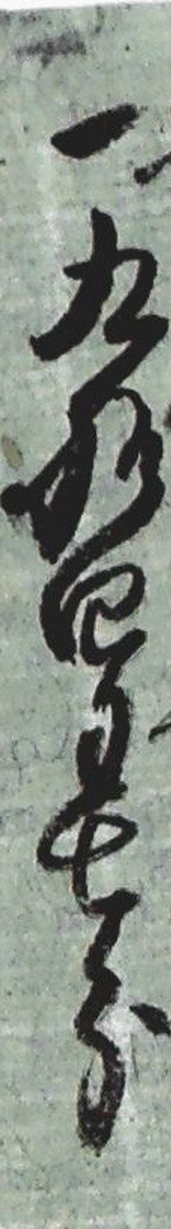一九拾四匁七分
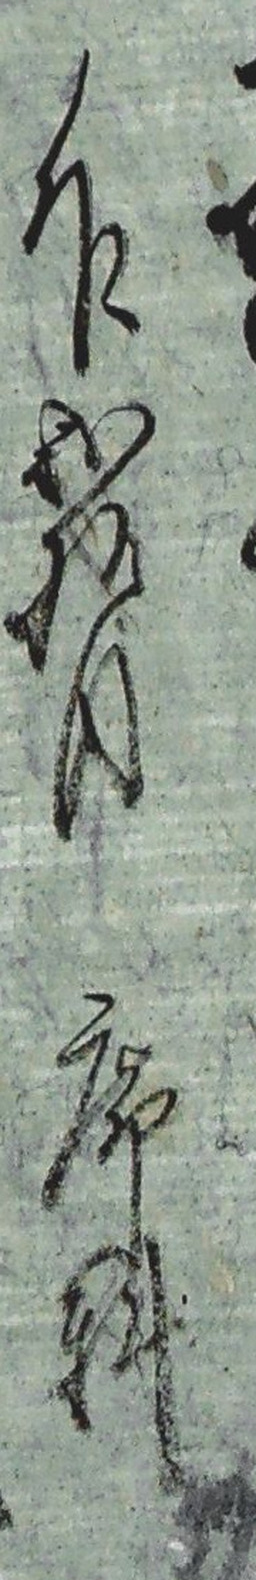外弐拾目席料
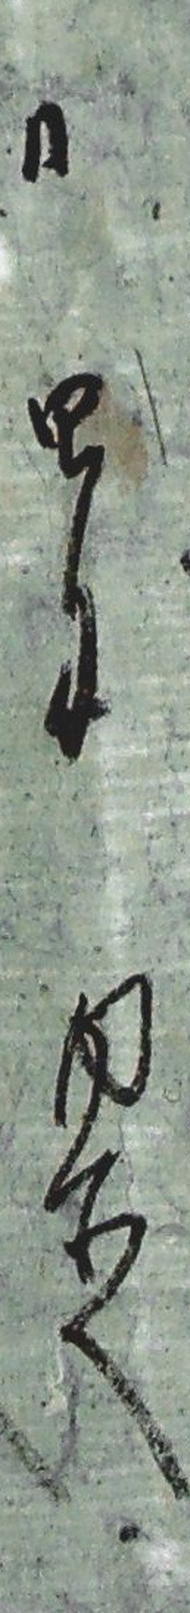同四匁内所へ
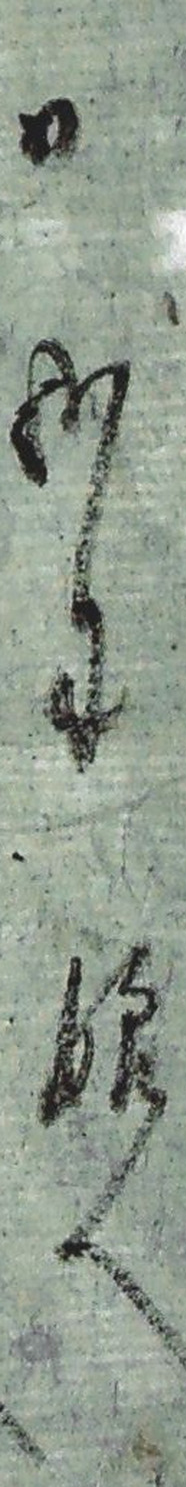同弐匁娘へ
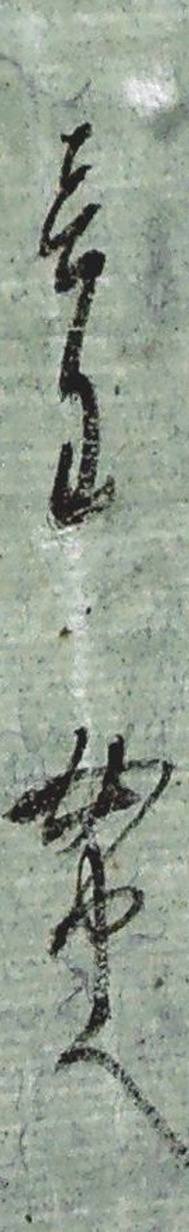同壱匁女中へ
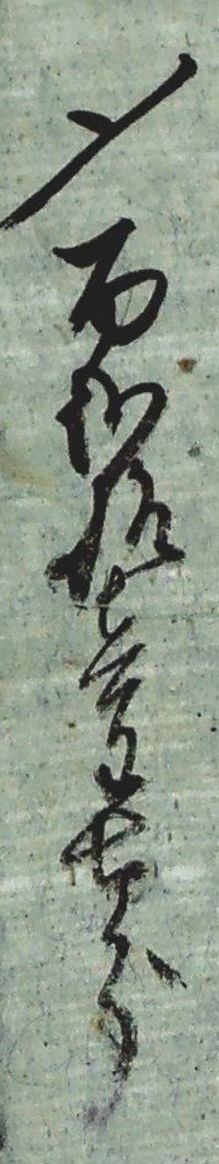〆百弐拾壱匁七分
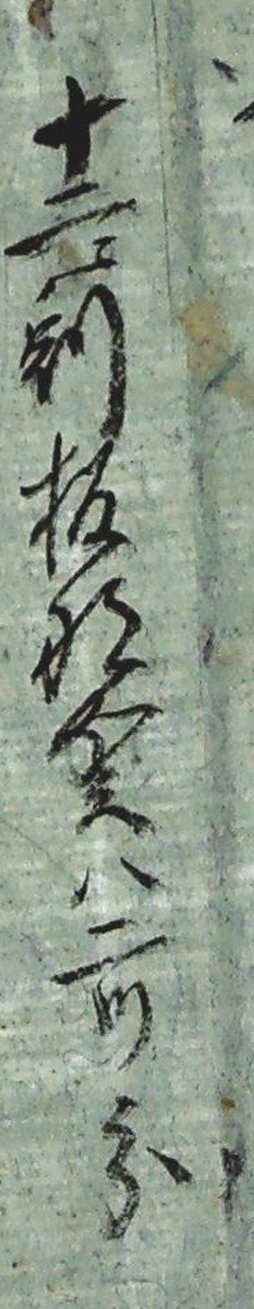十二に割板那賀は二つ分
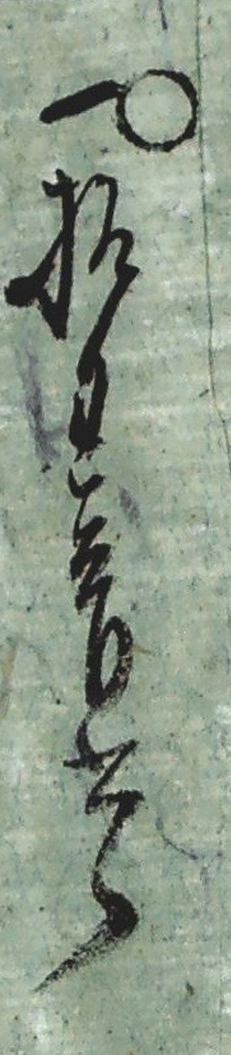一拾匁壱分六厘
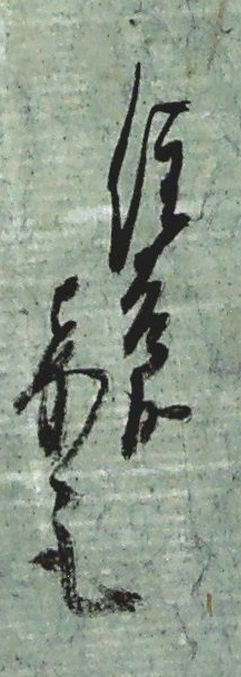住吉屋
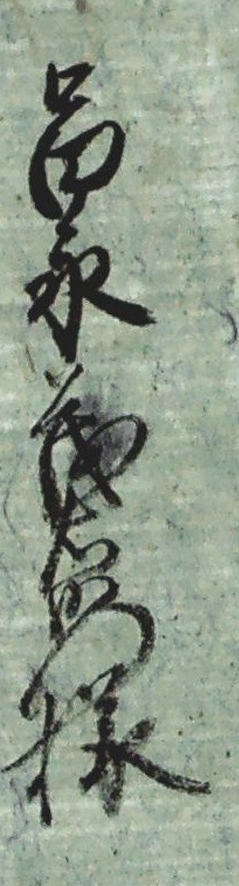富永茂右衛門様

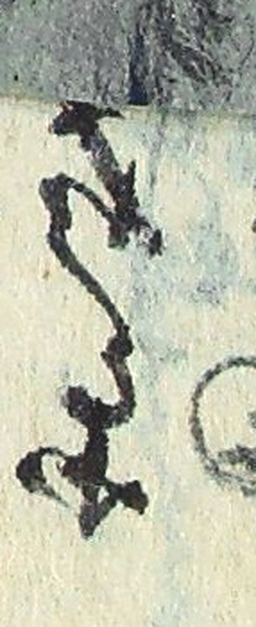十三日
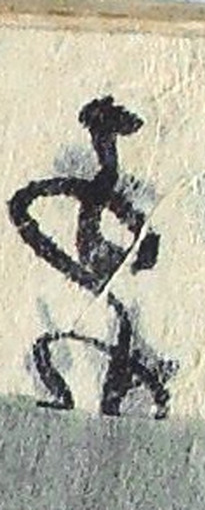十三日
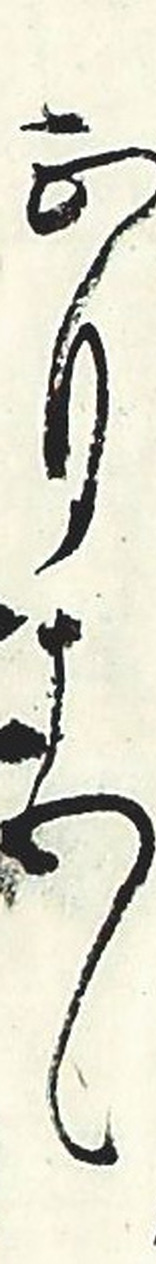正月十五日
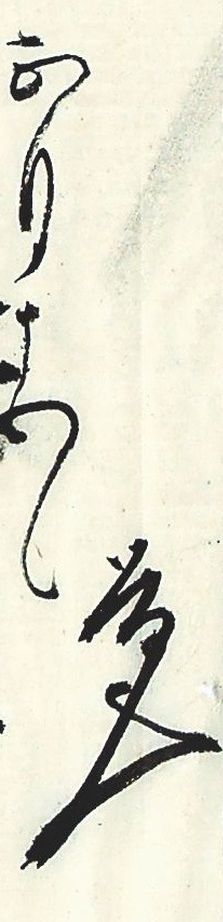正月十五日
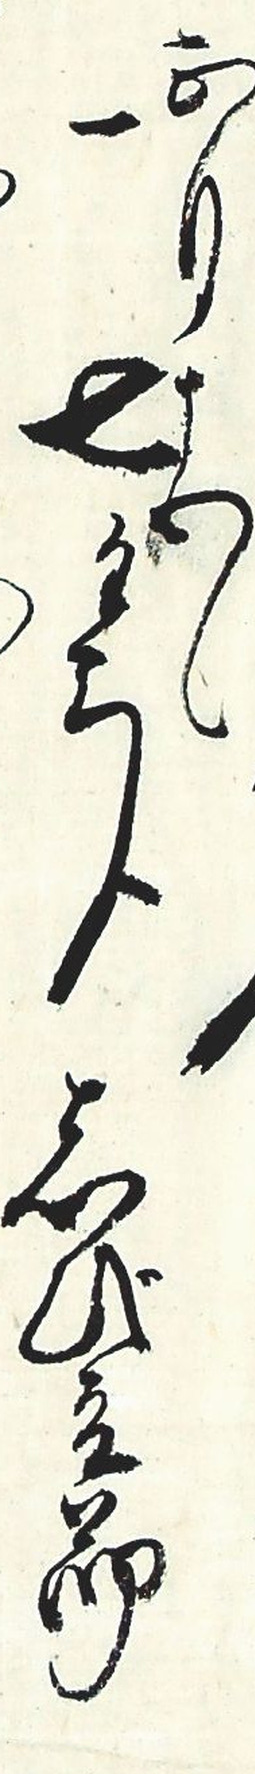一七匁三分しび壱節
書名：名東郡中諸割賦元帳
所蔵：鳴門教育大学 Naruto University of Education
